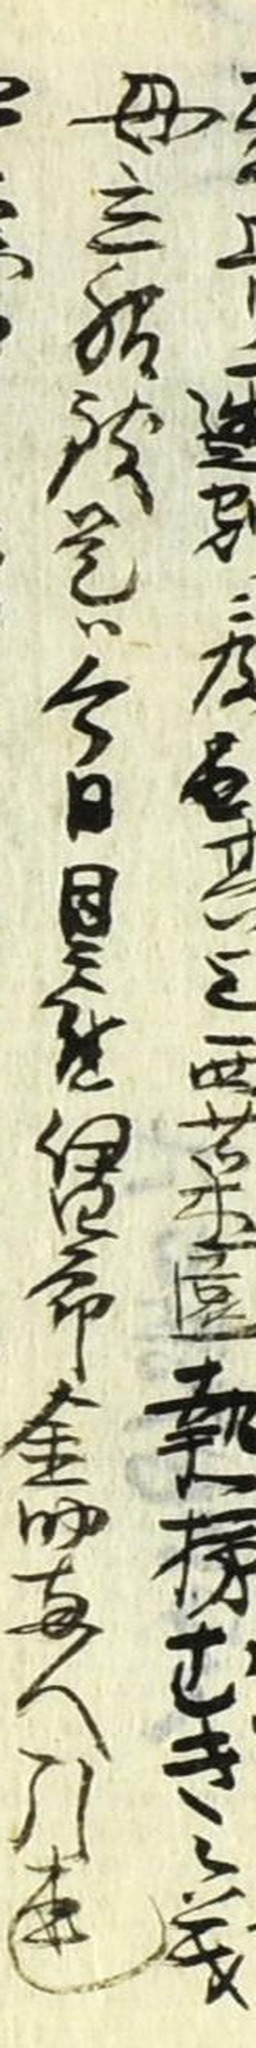母立服致是ハ今日日雇伊四郎金助両人引連
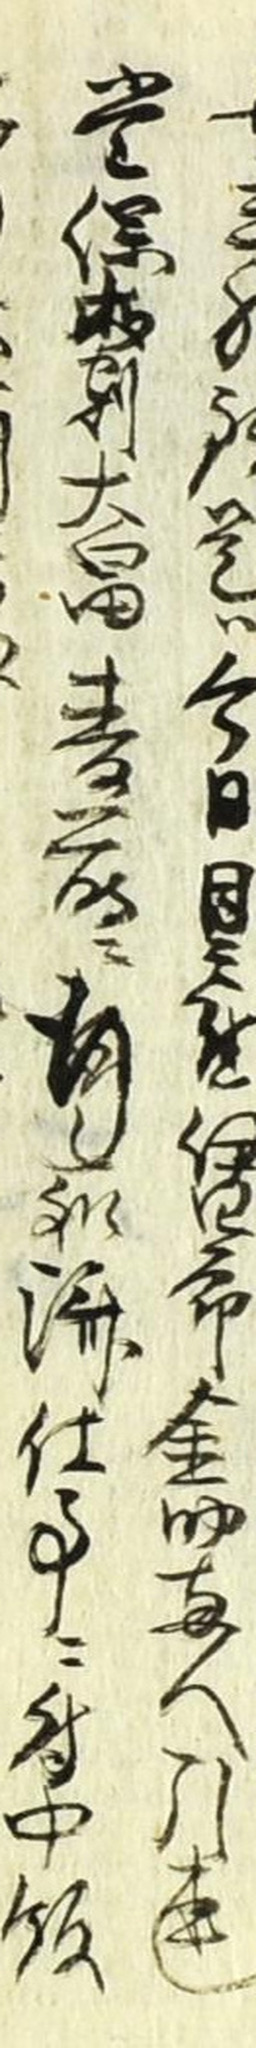堂保板刻大畠麦蒔ニ行候処済仕事ニ付中飯
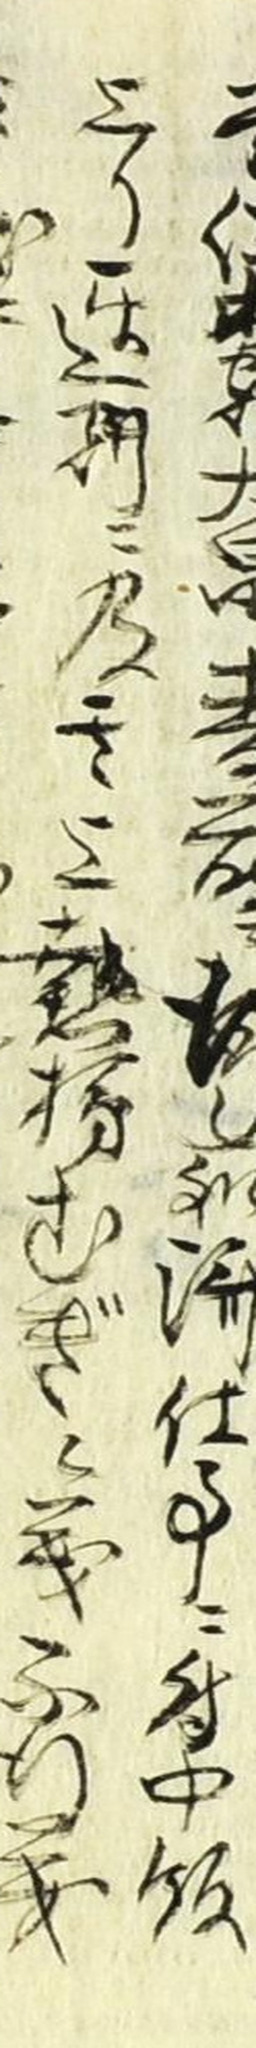上り遅刻ニ及其上熟柿むぎ候義不行義
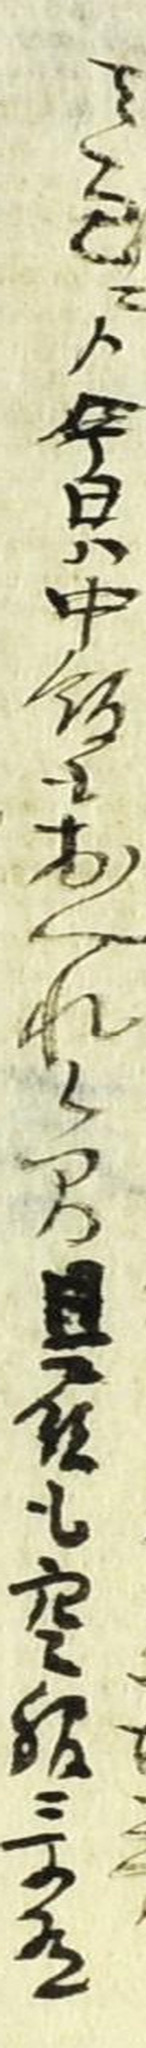之至ニ候今日ハ中飯もおくれ候間日雇も空服ニ可有
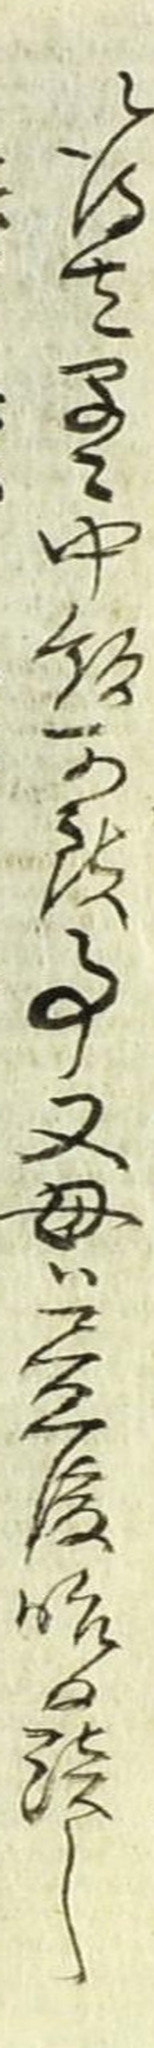候得者早々中飯可致事又母ハ昼後昨日談し
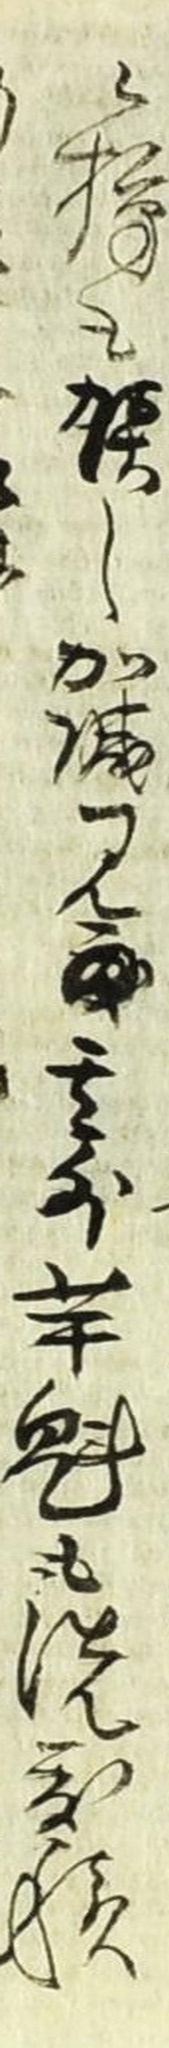候柿もし加減見度其外芋魁も洗度積
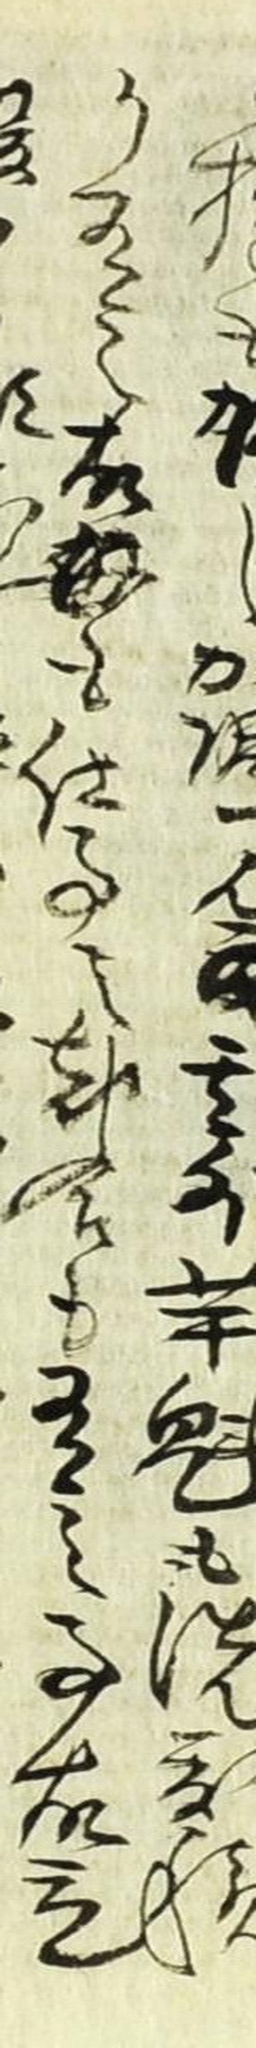り有之故母も仕事之都合も有之事故立
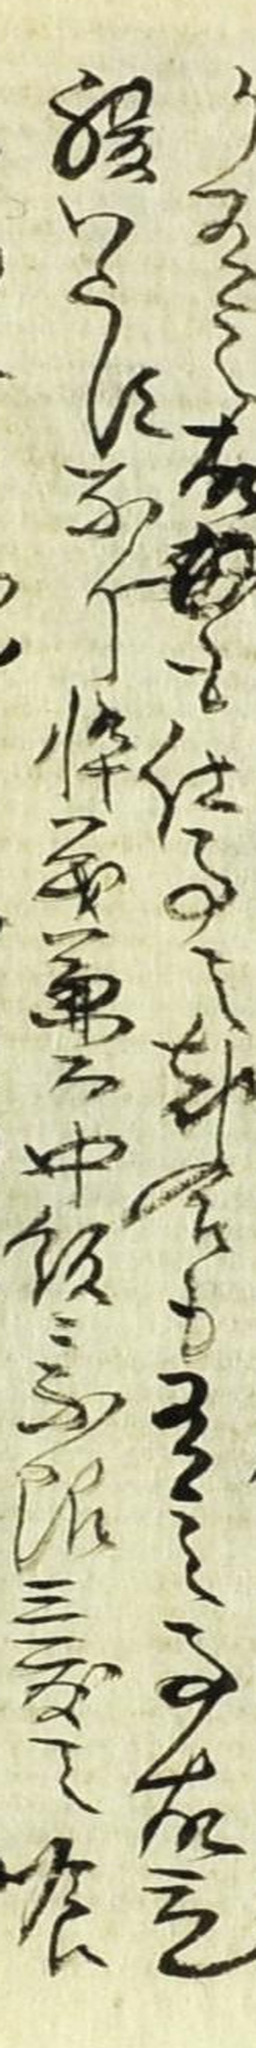腹いたすなり倅茂兼而中飯ニ不限三度之喰
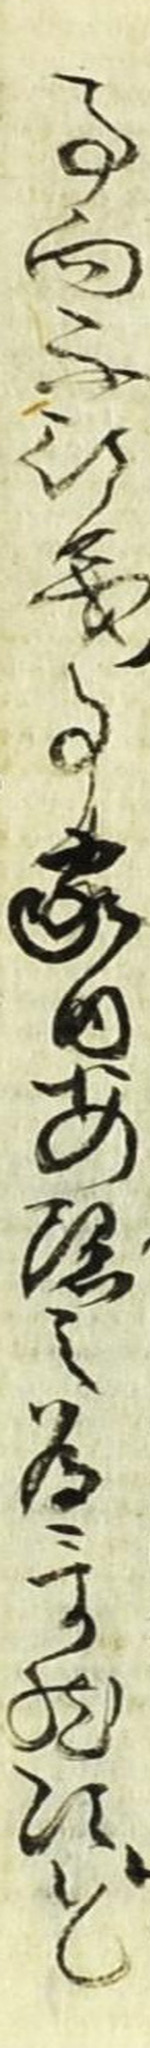事向不行義ノ事家内安隠之為ニ可然頃と
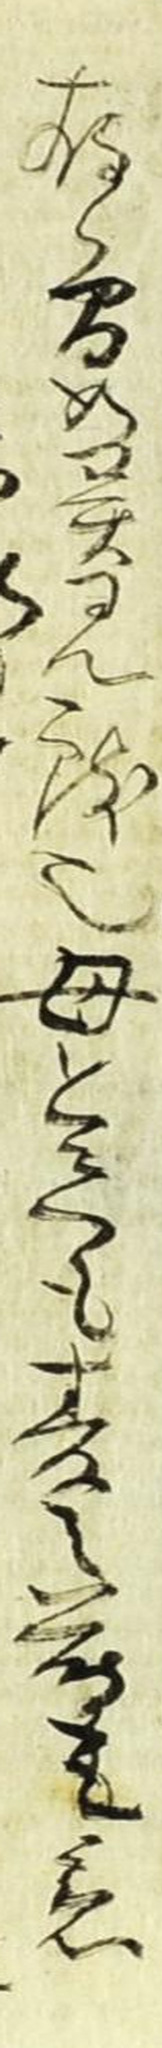存候間如異見致也母とても麦之蒔之急
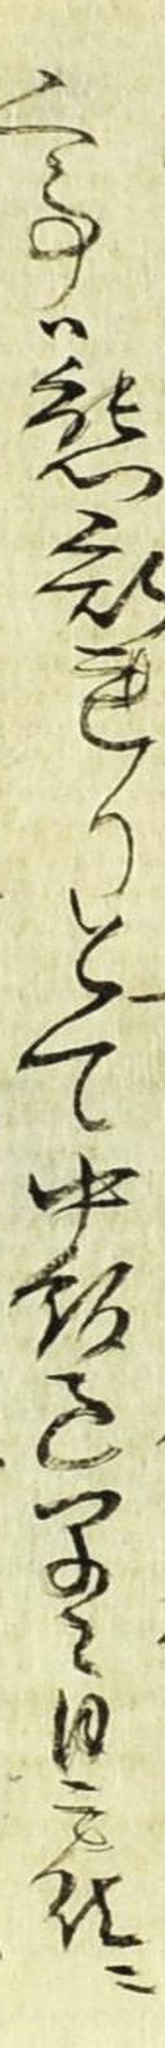く事ハ態知れりとて中飯過早々日雇ニ
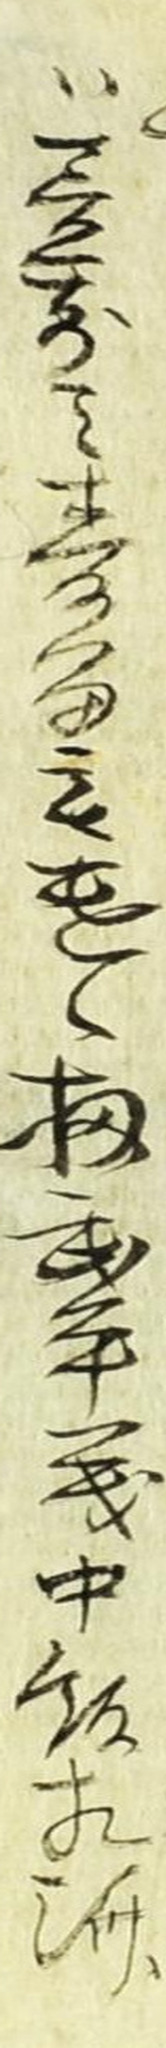ハ昼前之麦留被遣候扨武平義中飯相済
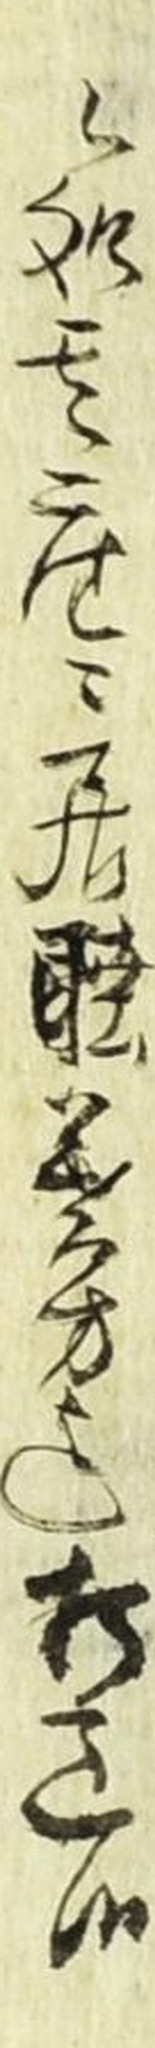候処其座ニ居睦暮方迄打過候

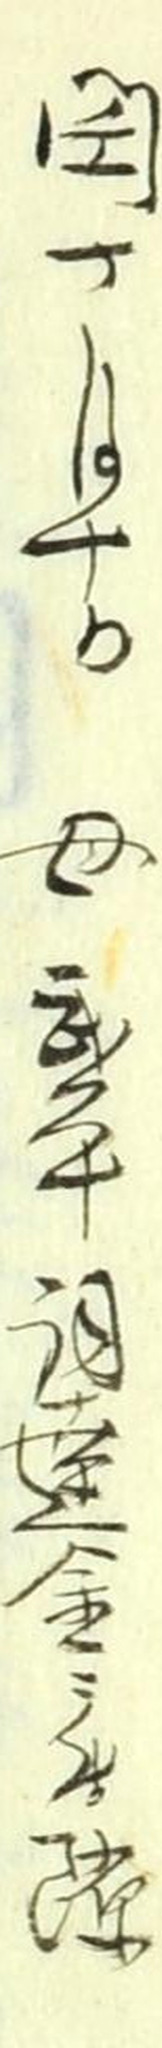閏十月十日母武平調達金ニ付隙
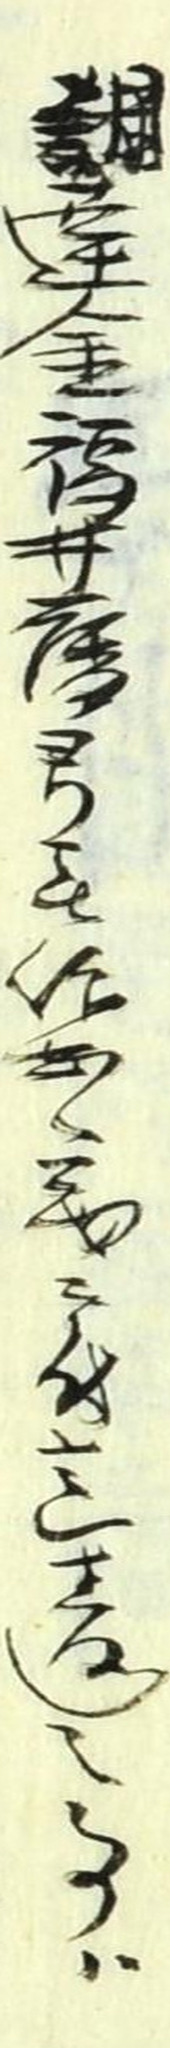調達金福井藩ヨリ被仰出候義ニ付意違之事ハ
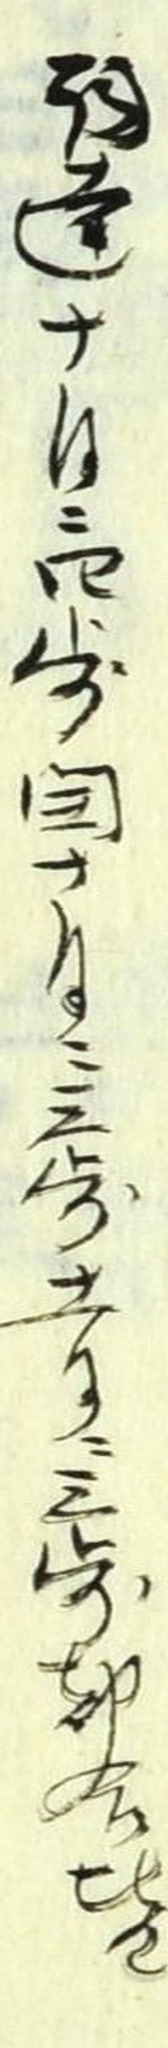調達十月ニ四歩閏十月ニ三歩十一月ニ三歩都合皆
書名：（日記）
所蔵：福井県文書館 Fukui Prefectural Archives
